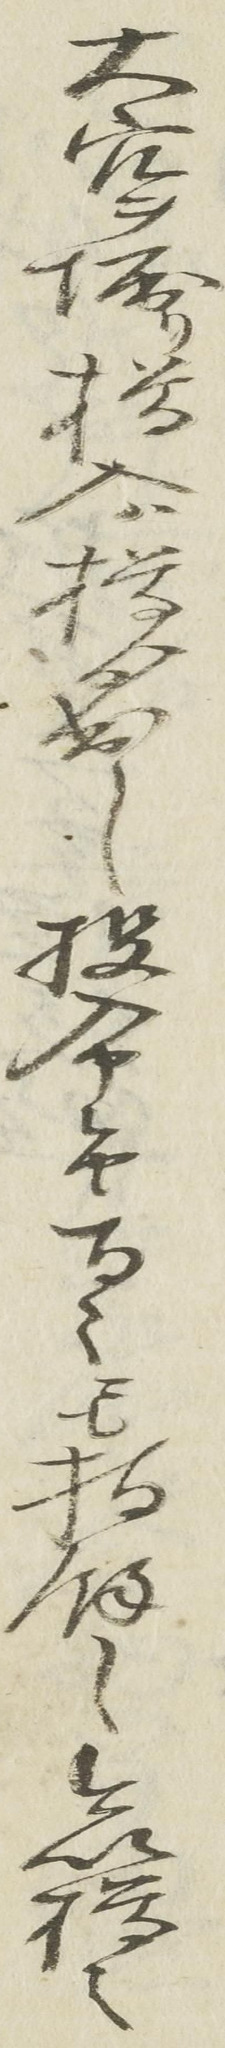大穴ヲ掘り樽入ハ樽ゟ出し投入申候由寺〻ニも持余し今以樽之
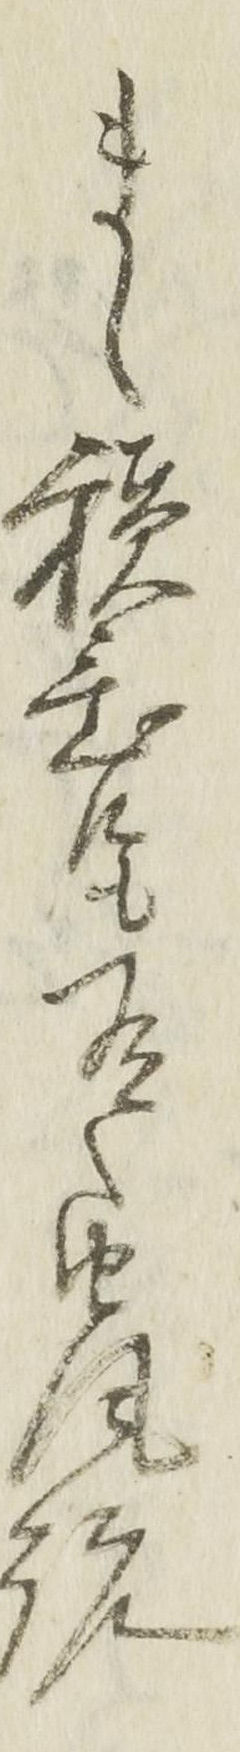まゝ積置候も有之由風説
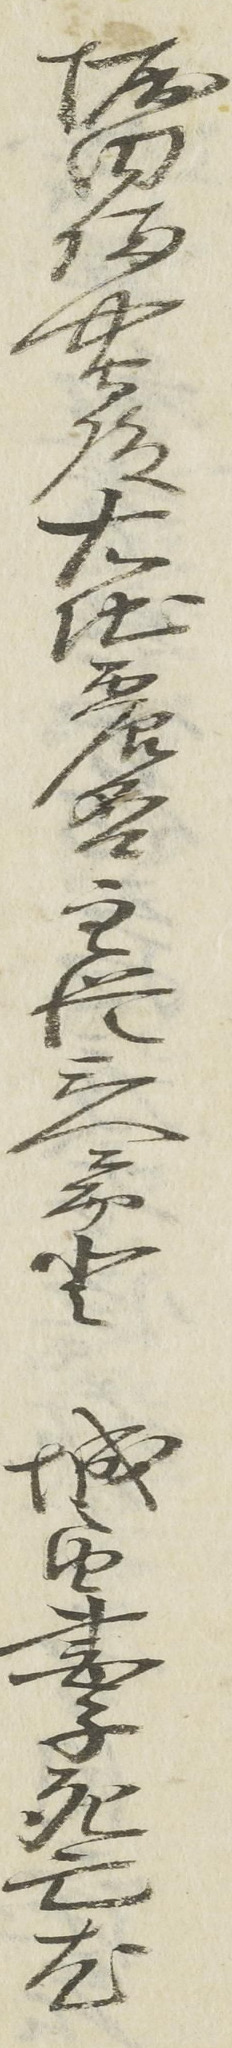一堀田備中守殿右地震否主従三人ニ而登城之由妻子死亡尤
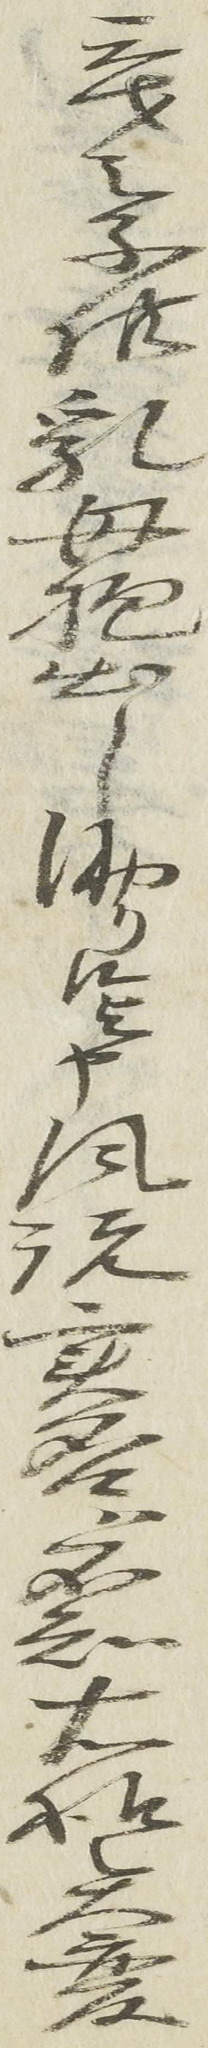三才之子供乳母抱出し助り候と申風説実否ハ不知右様之大変
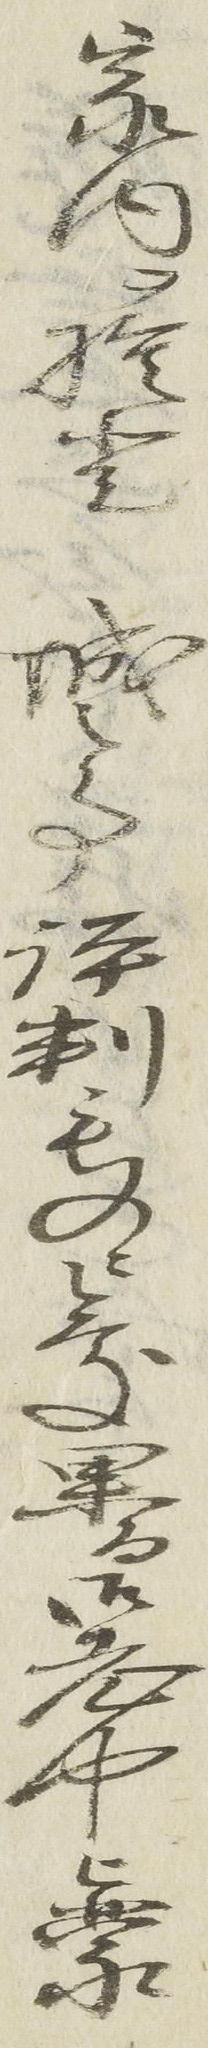家内ヲ捨登城之事評判ものニ候処果而御老中被蒙
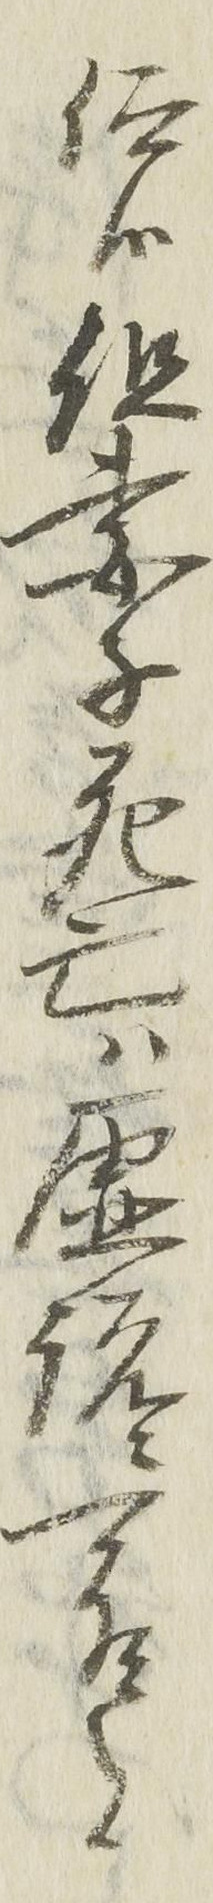仰候但妻子死亡ハ霊説に可有之候
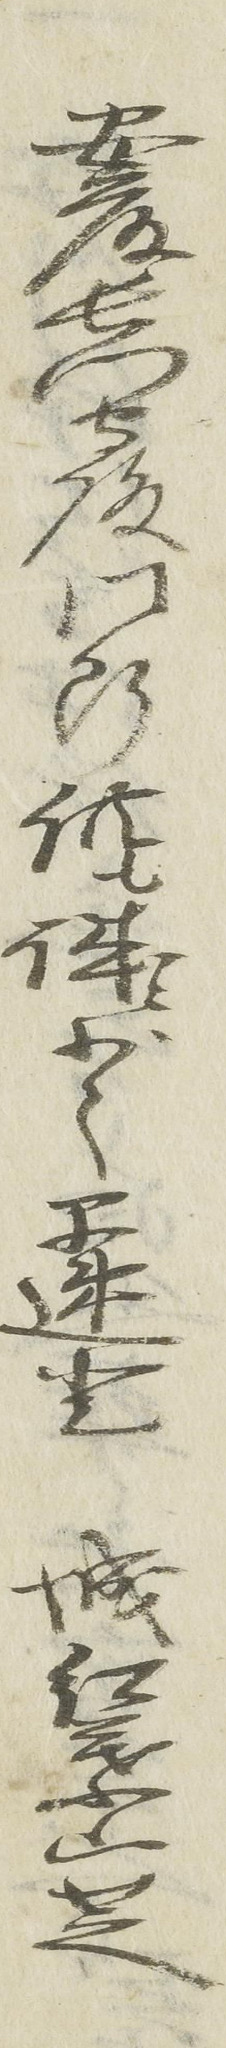一安藤長門守殿同断供も誠ニ少く早速登城紅葉山芝
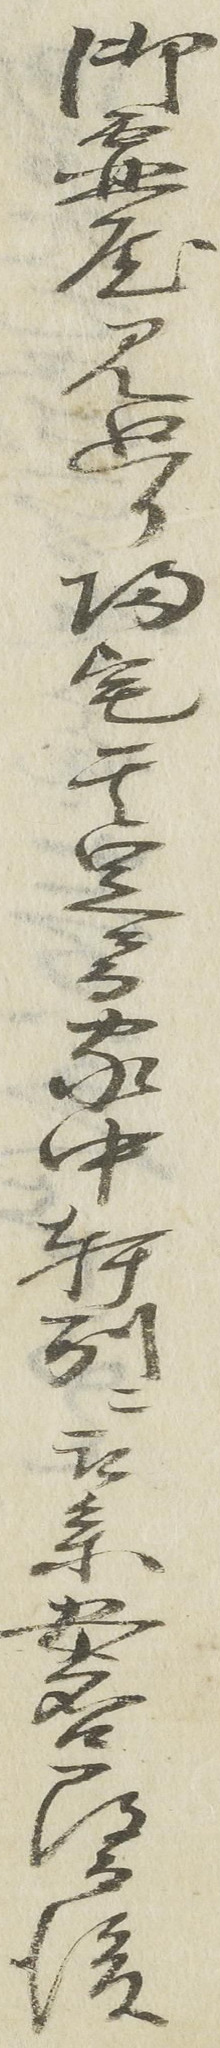御霊屋見廻り帰宅其足ニ而家中軒別ニ被参安否尋而後
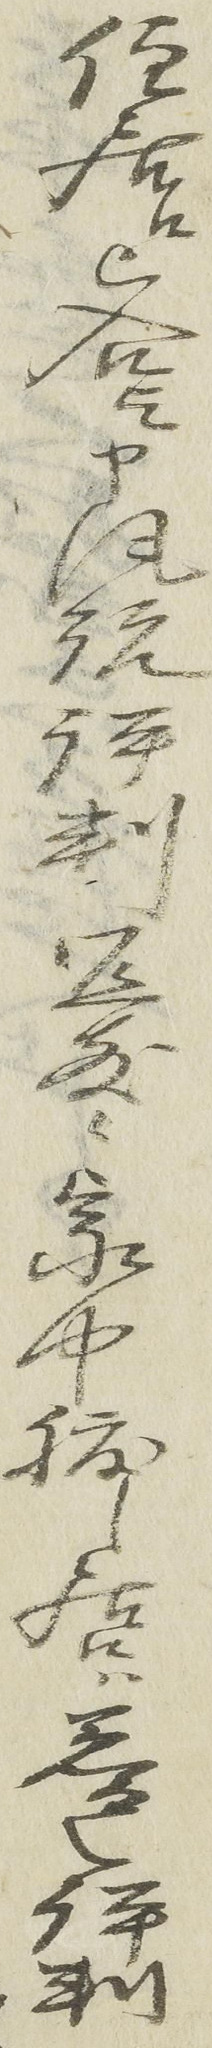住居江被入候と申風説評判宜敷候家中腹之居候ハ差而之評判ニ候

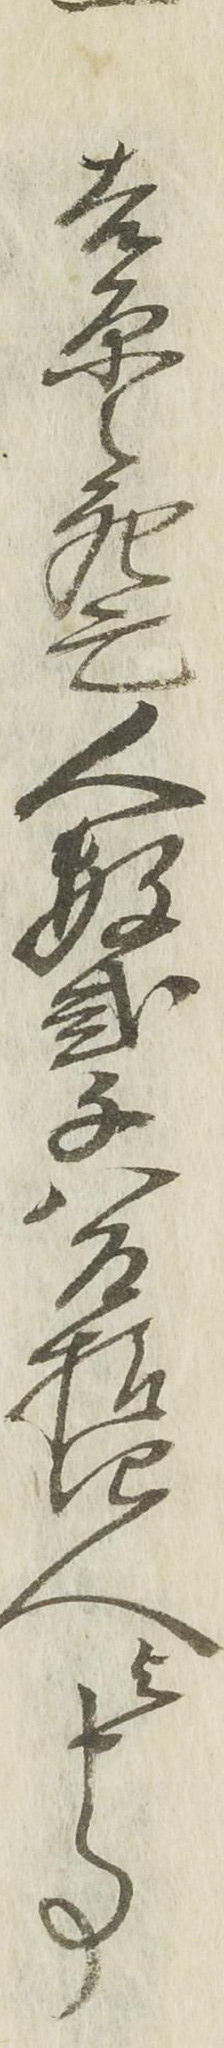一吉原之死亡人数弐千八百拾四人と申事
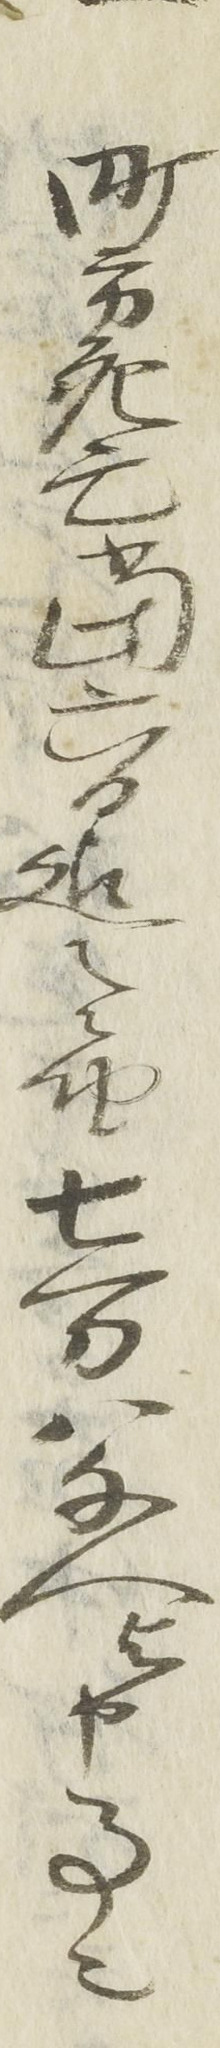一町方死亡当六日迄之届七万八千人と申事也
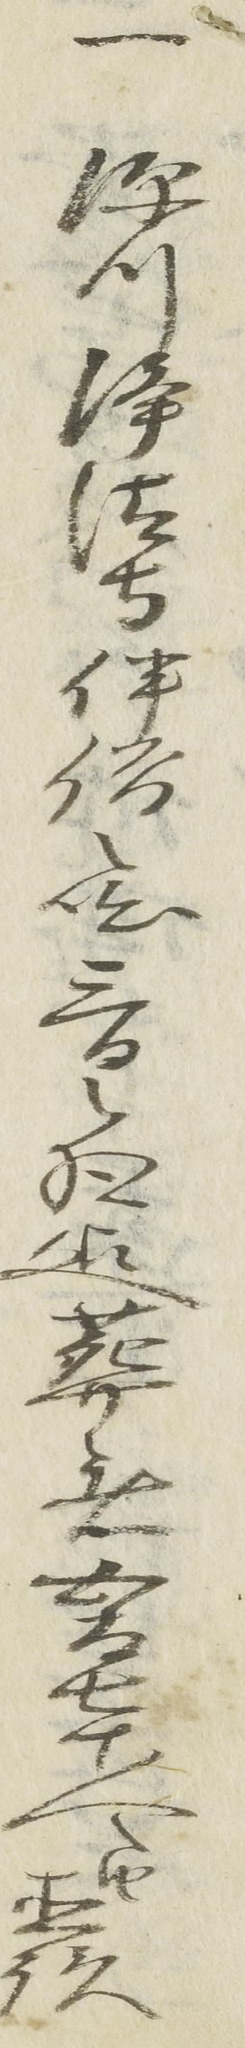一深川浄法寺伴僧之咄三日之夜迄葬候者五百七十人之由直談
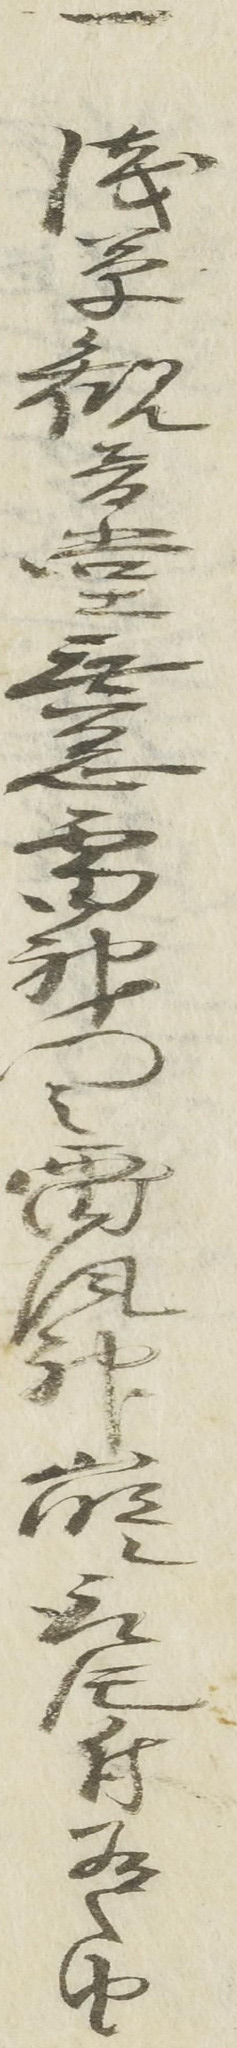一浅草観音堂無念雷神門の雷風神崩レ取片付有之由
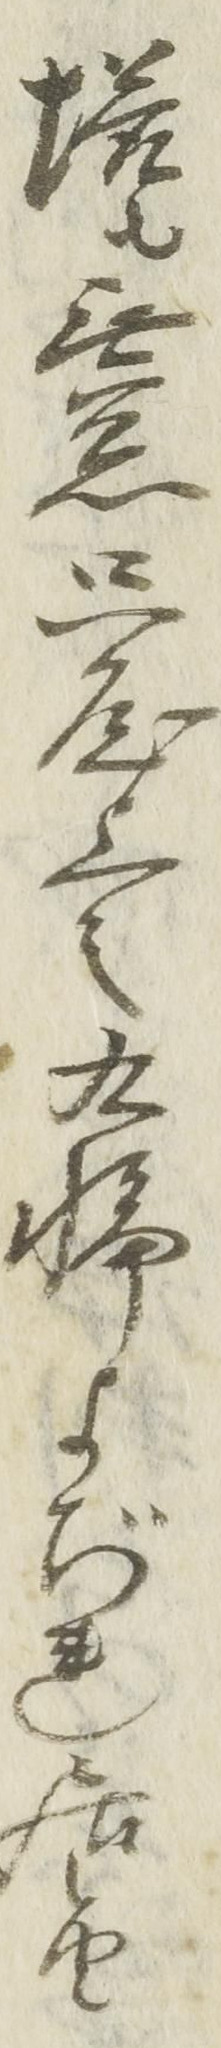塔も無念只屋上之九輪よぢれ居候由
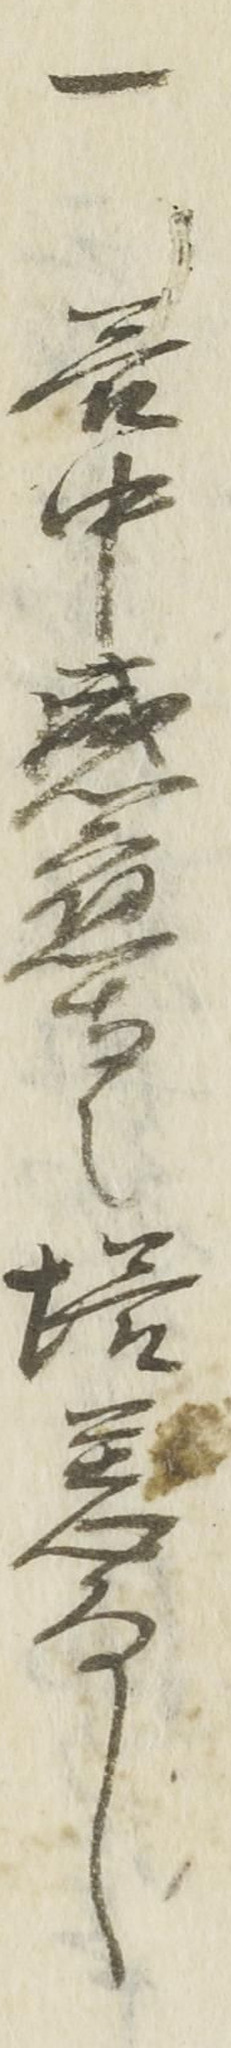一谷中感応寺之塔恙なし
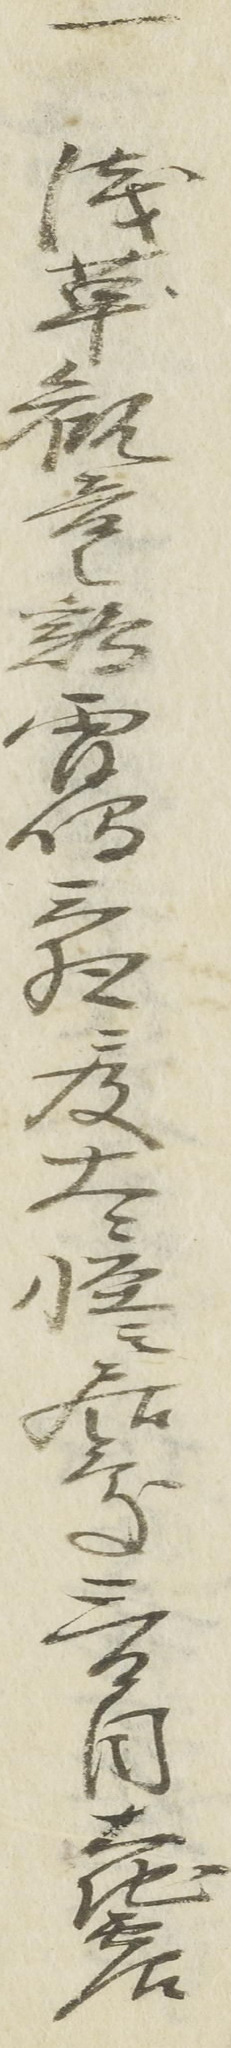一浅草観音之鶏宵鳴三夜ニ及大ニ怪ミ居候処三日目大地震
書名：安政乙卯江戸大地震筆記　安政丙辰八月大阪大雷雨之記追加　安政三辰年七月松前辺大地震并八月大風雨記録
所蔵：東京大学地震研究所図書室 Earthquake Research Institute Library, The University of Tokyo, JAPAN
